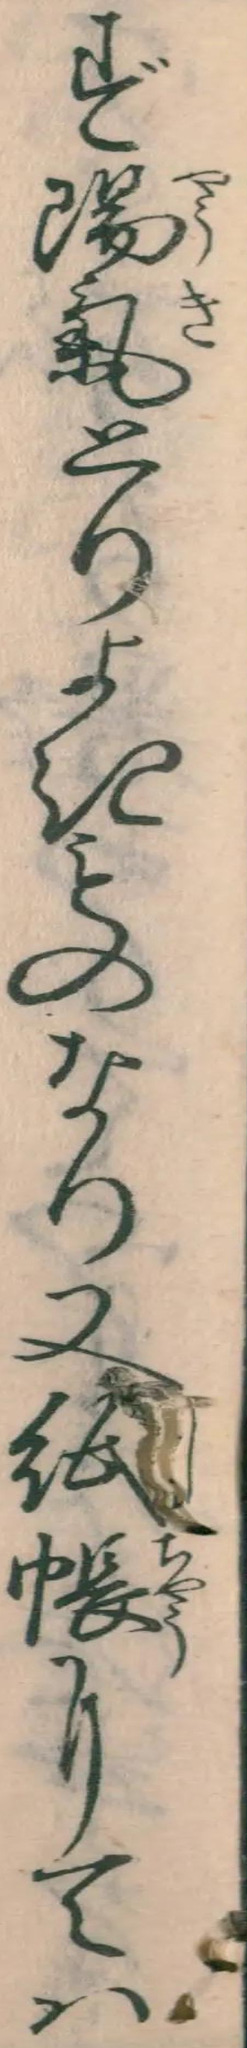ず陽気とりよきものなり又紙帳にては
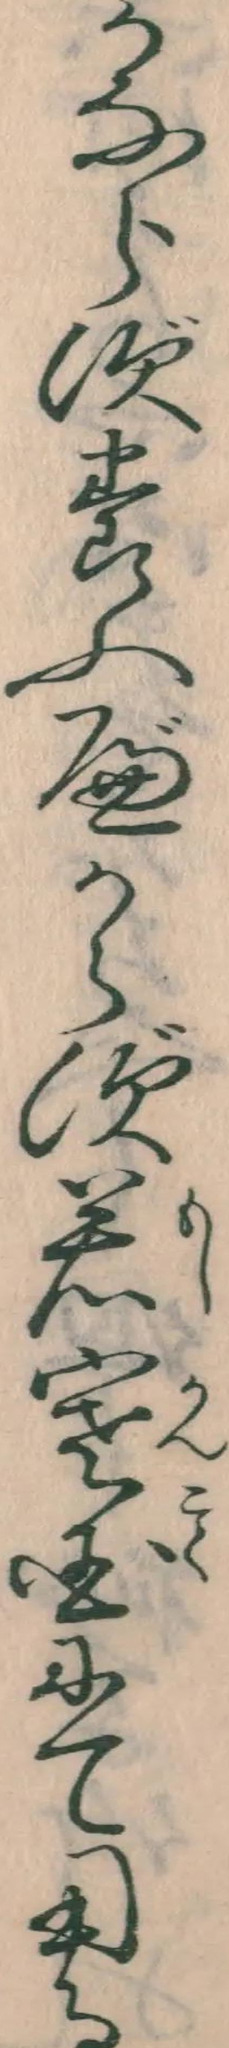かならず養ふべからず若寒国にて用る
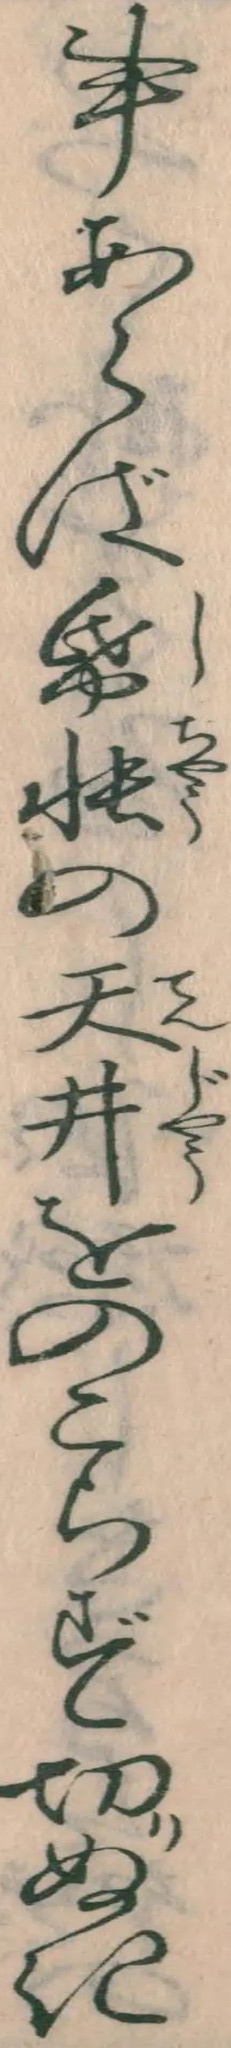事あらば紙帳の天井をのこらず切りぬき
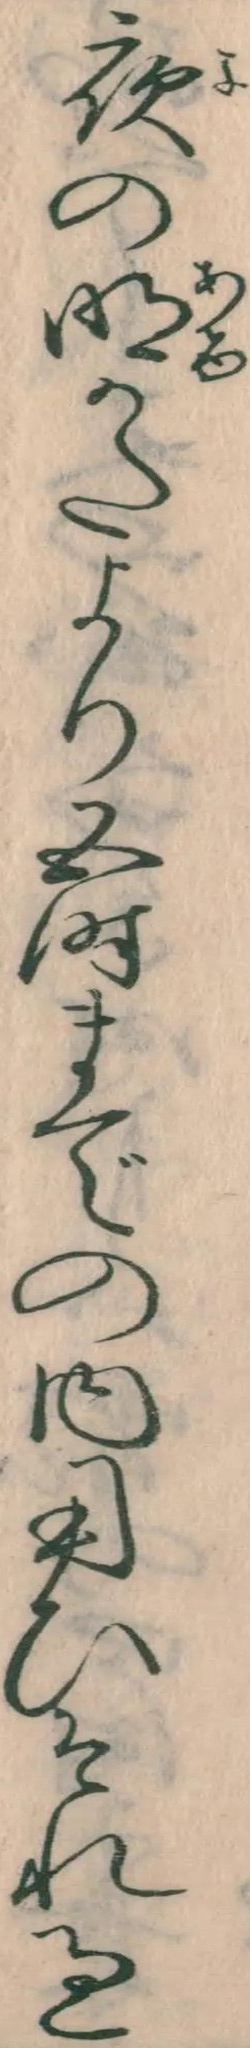夜の明かたより五時までの内用ひそれ過
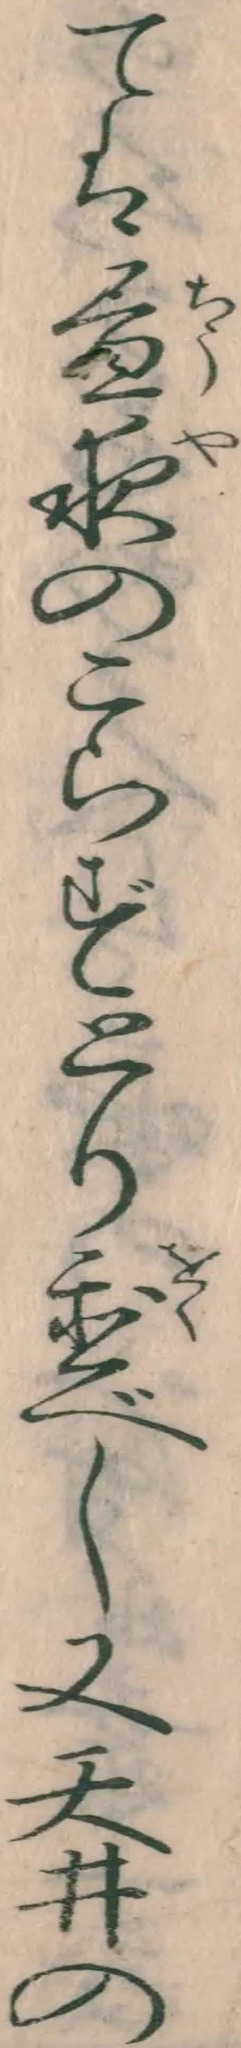ては昼夜のこらずとり置べし又天井の
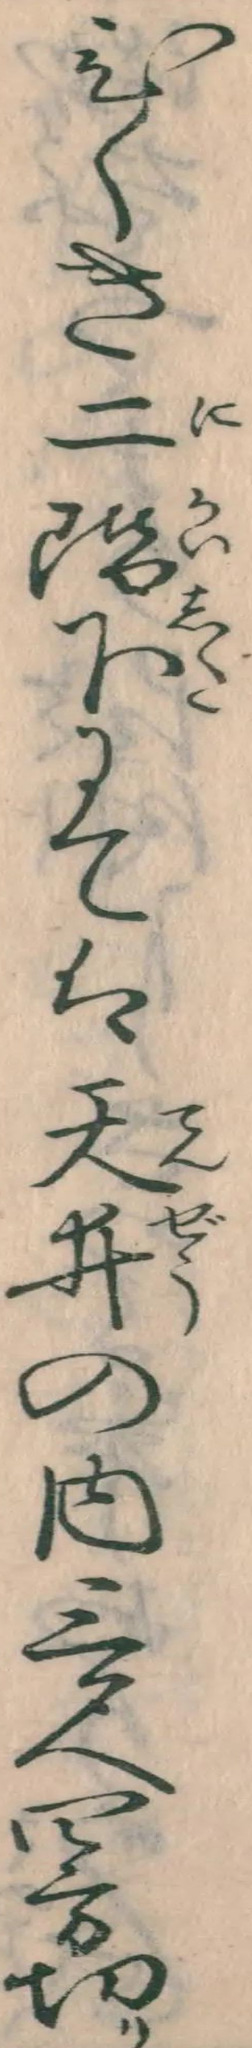ひくき二階下にては天上の内三尺四方切り
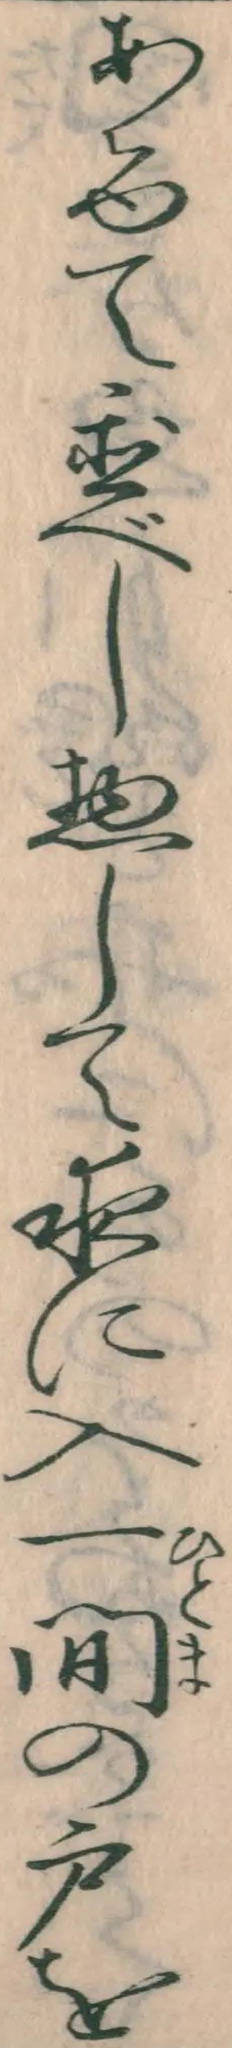あけて置べし惣して夜に入一間の戸を
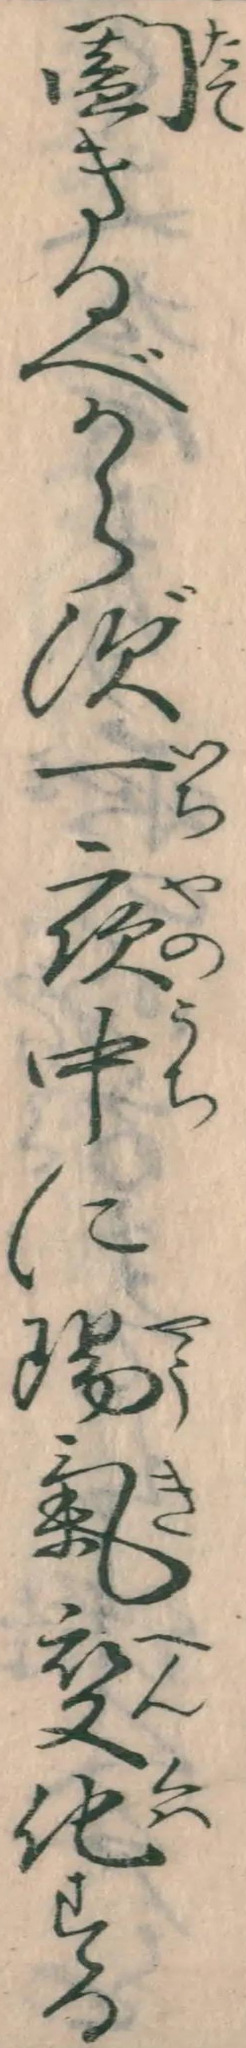闔きるべからず一夜中に陽気変化する
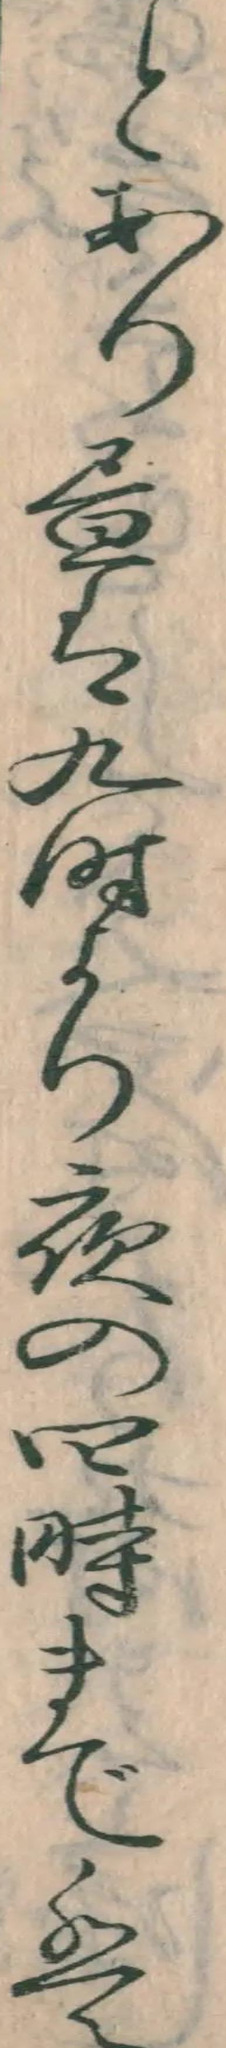ことあり昼は九時より夜の四時までは

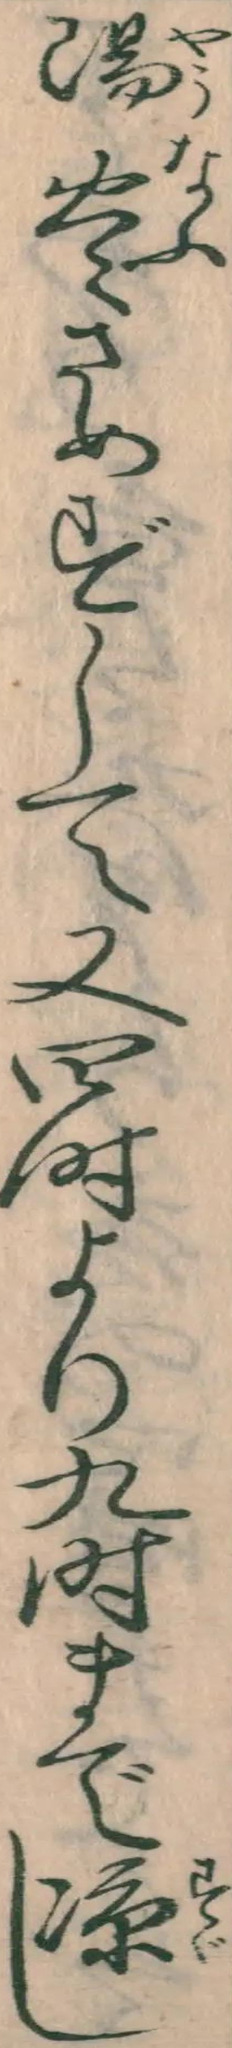陽炎さめずして又四時より九時まで涼し
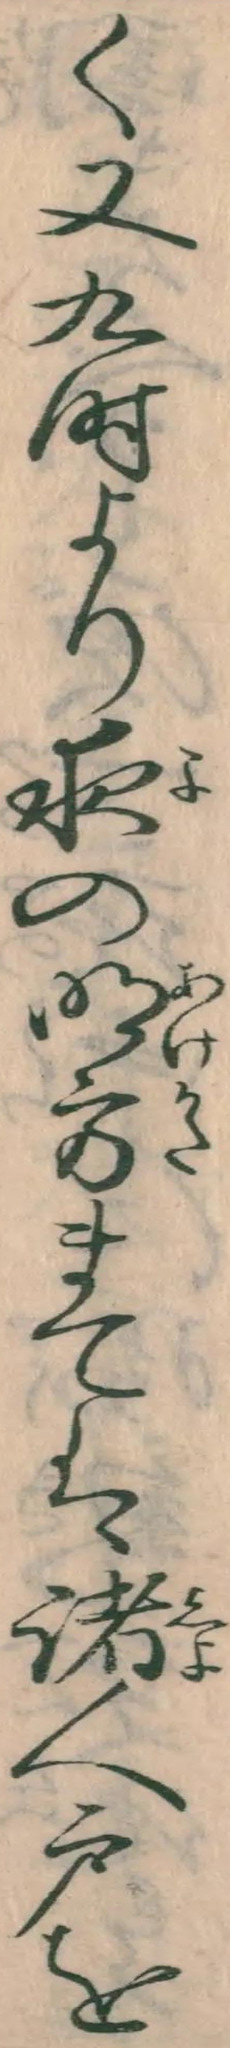く又九時より夜の明方まては諸人戸を
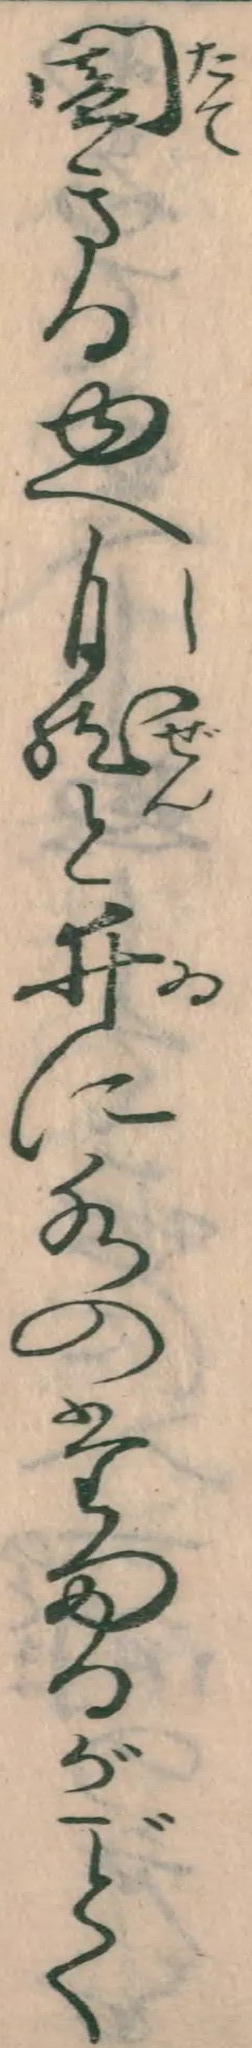闔きるゆへ自然と井に水のたまるがごとく
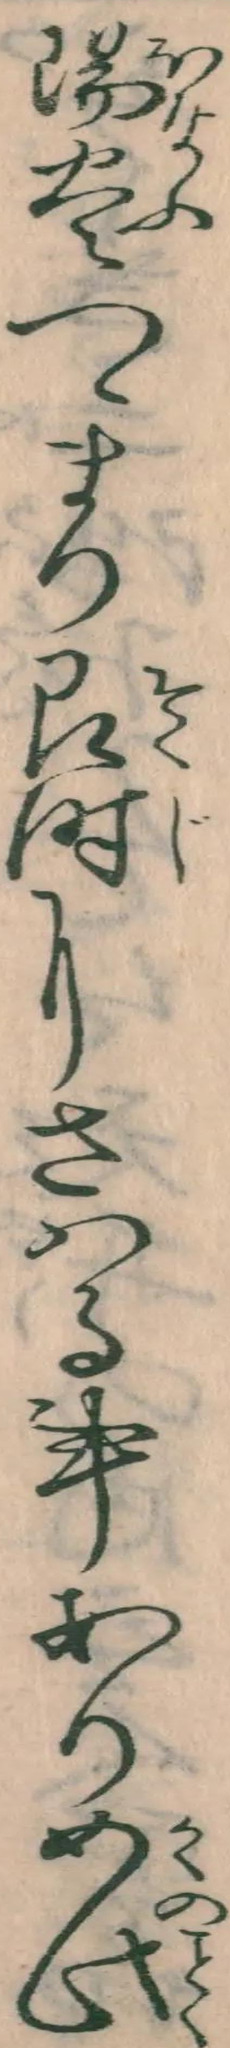陽炎つゝまり即時にさわる事あり如此
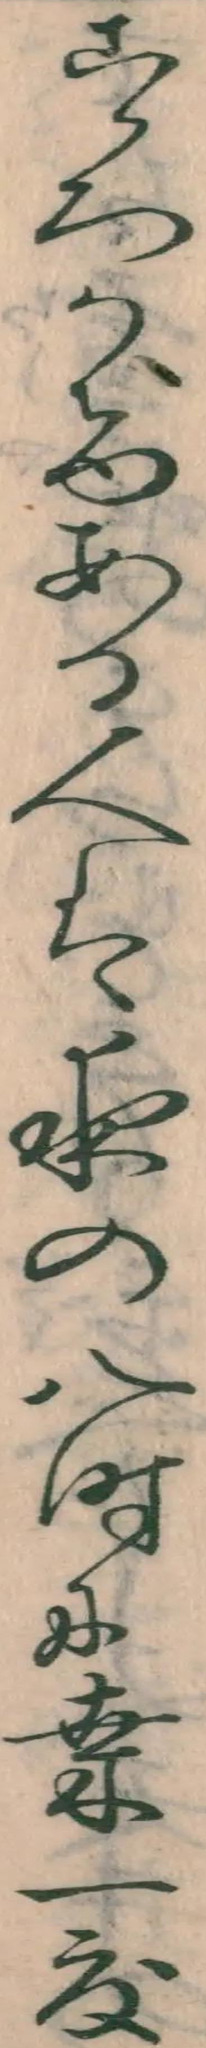こゝろかけある人は夜の八時に桑一度
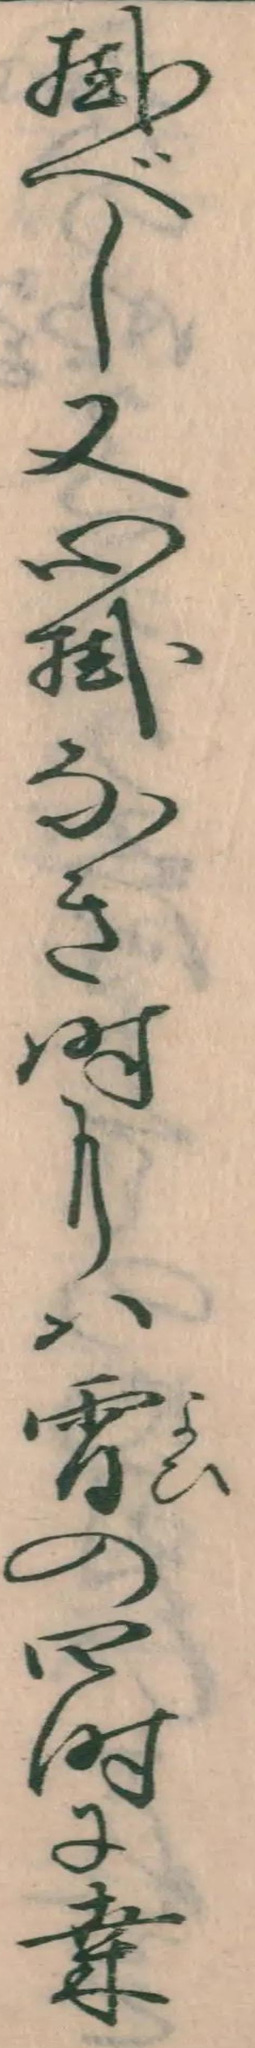掛べし又心掛なき時には宵の四時に桑
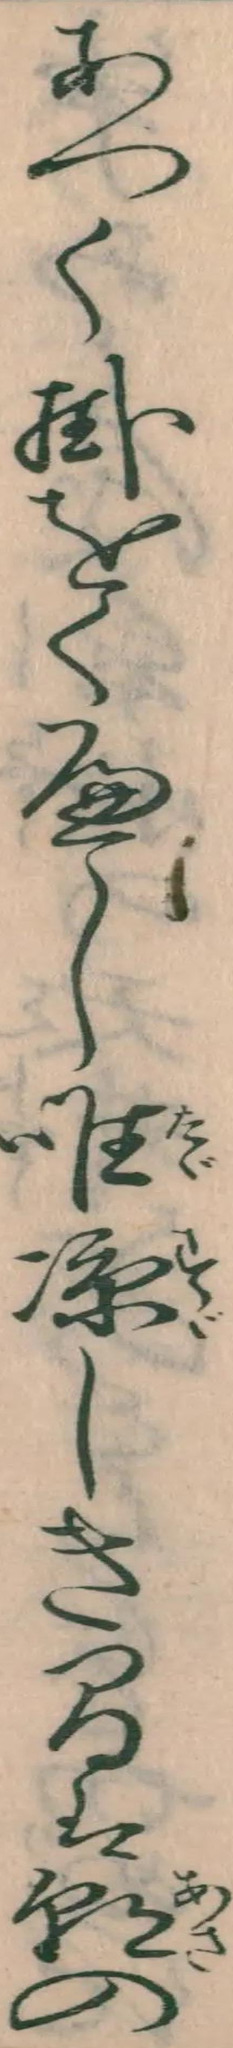あつく掛をくへし唯涼しき間は朝の
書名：新撰養蚕秘書
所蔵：国立国会図書館 National Diet Library, JAPAN
